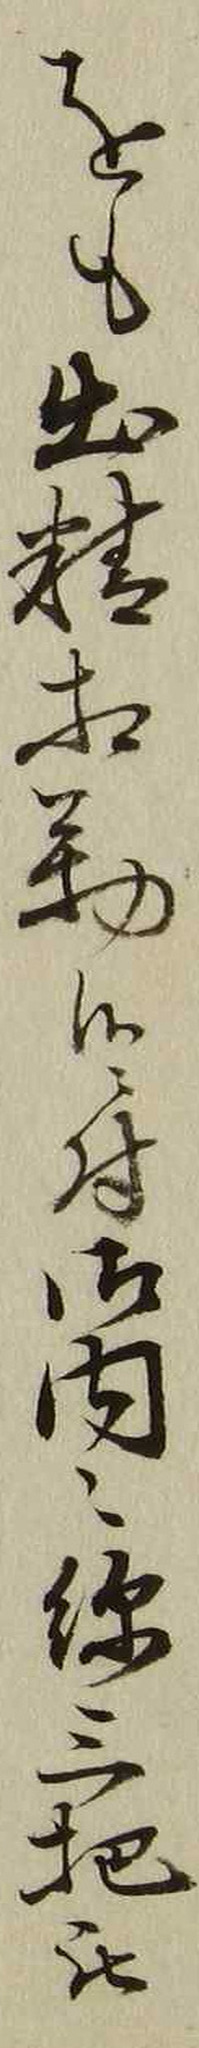をも出精相勤候ニ付御内々綿三把被
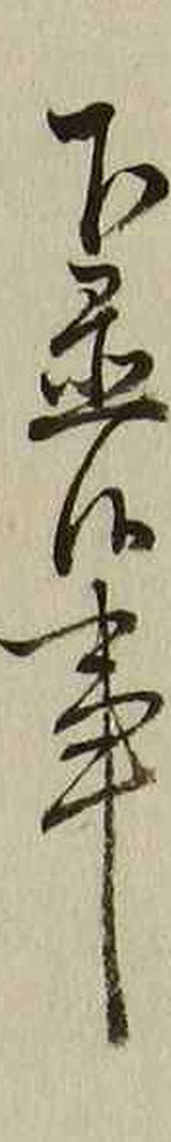下置候事
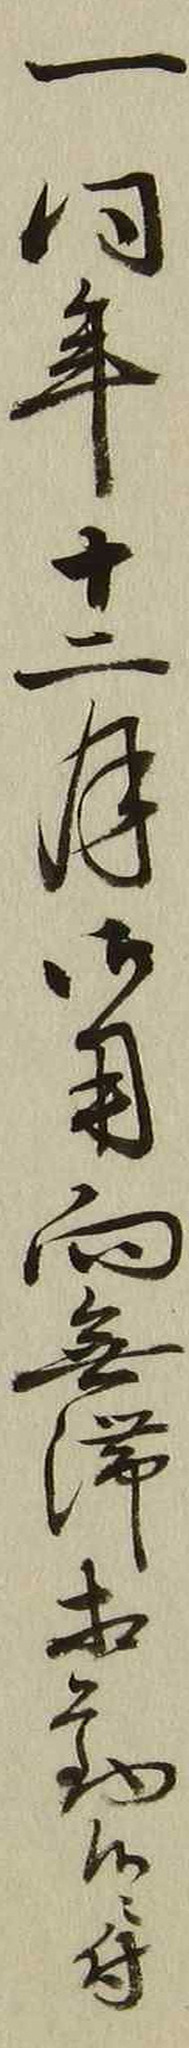一同年十二月御用向無滞相勤候ニ付
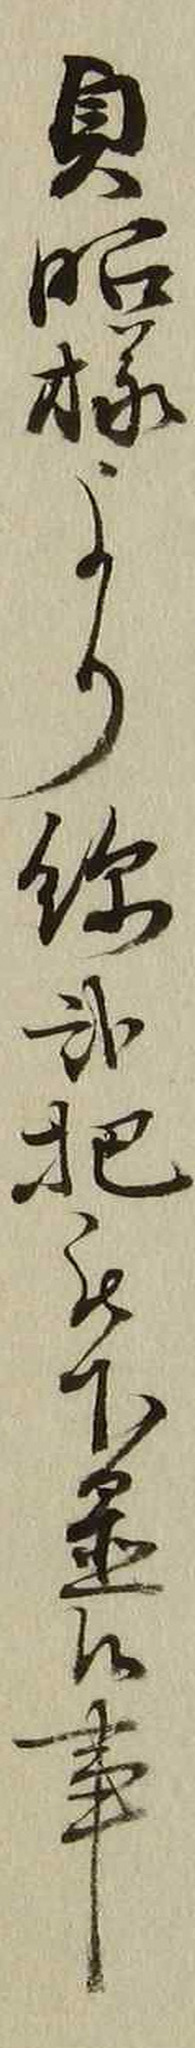貞昭様より綿弐把被下置候事
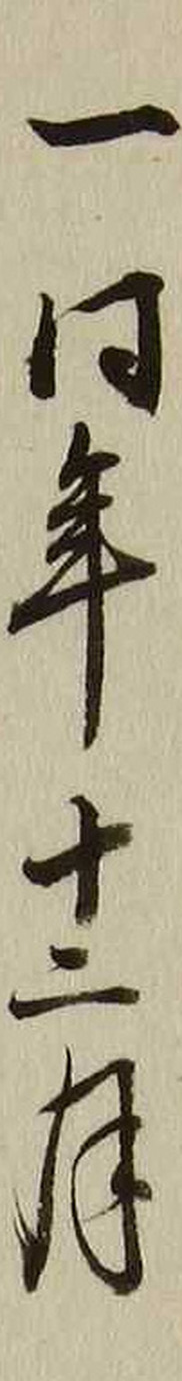一同年十二月
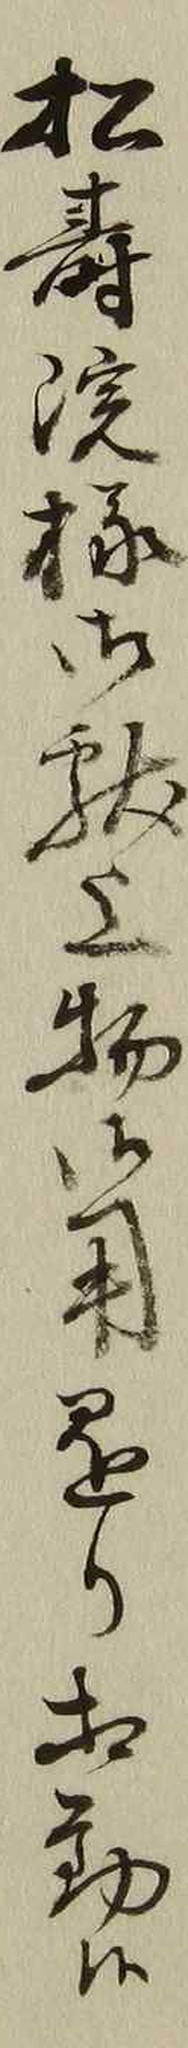松寿院様御献上物御用懸り相勤候
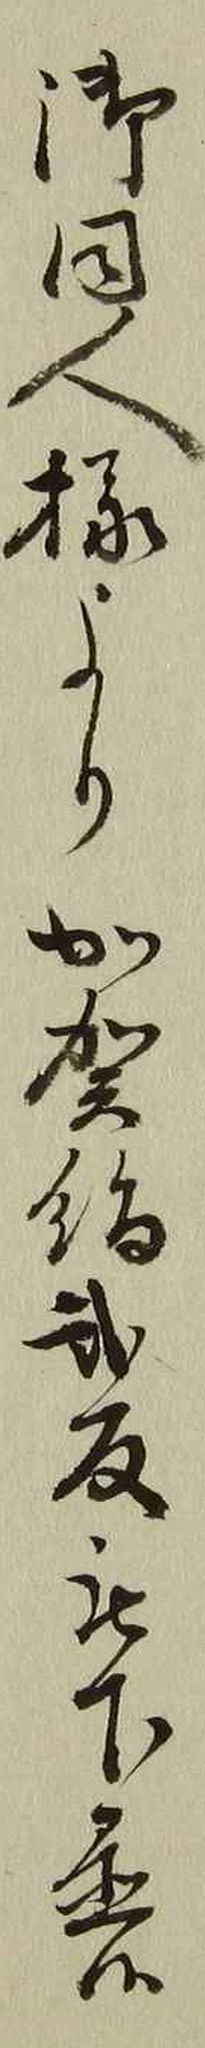御同人様より加賀絹弐反被下置候
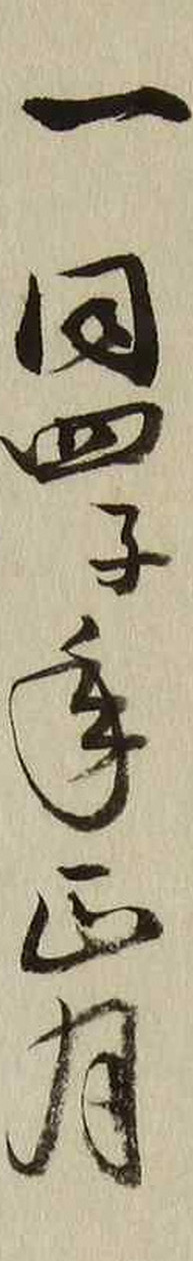一同四子年正月
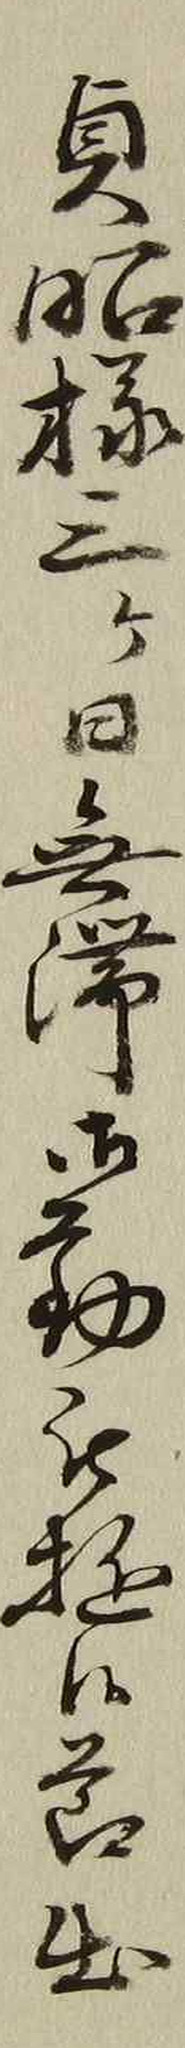貞昭様三ケ日無滞御勤被遊候節出
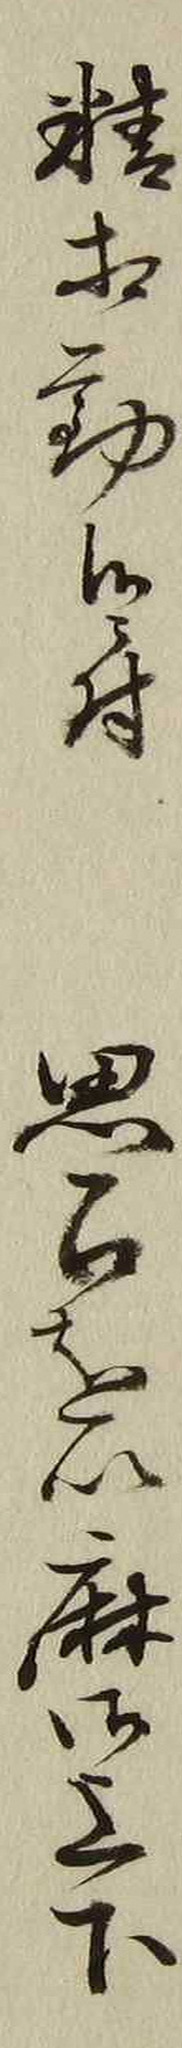精相勤候ニ付思召を以麻御上下
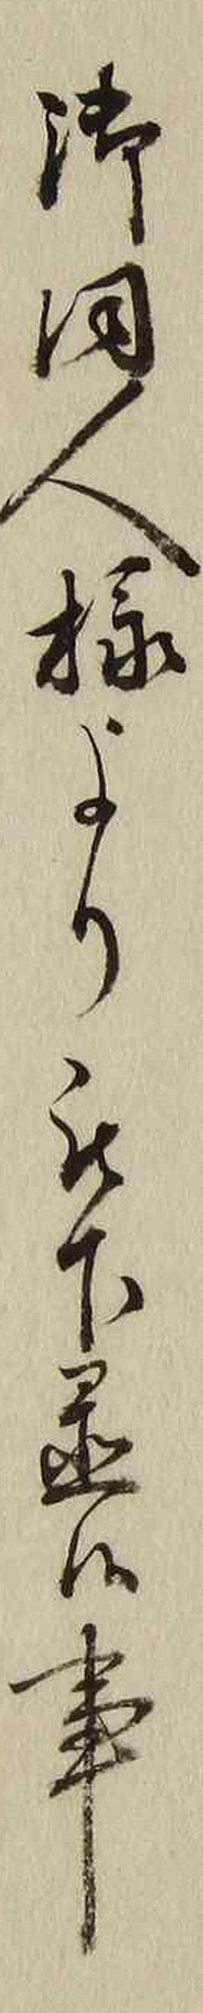御同人様より被下置候事
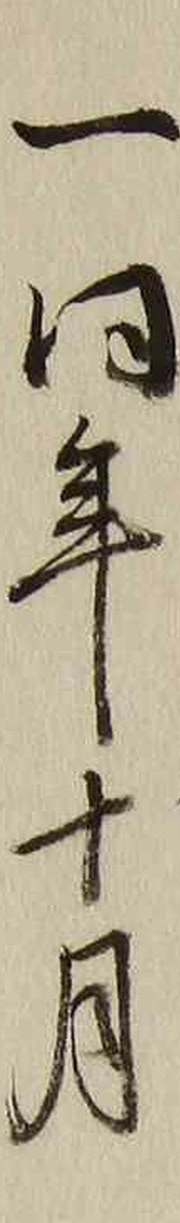一同年十月
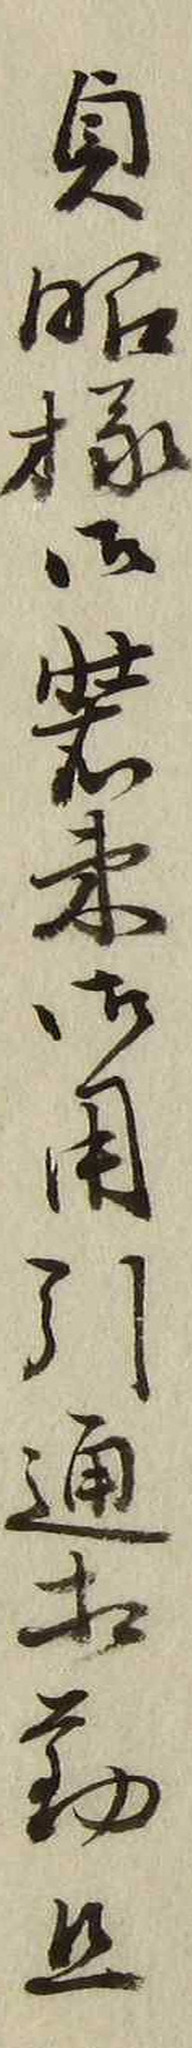貞昭様御装束御用引通相勤且
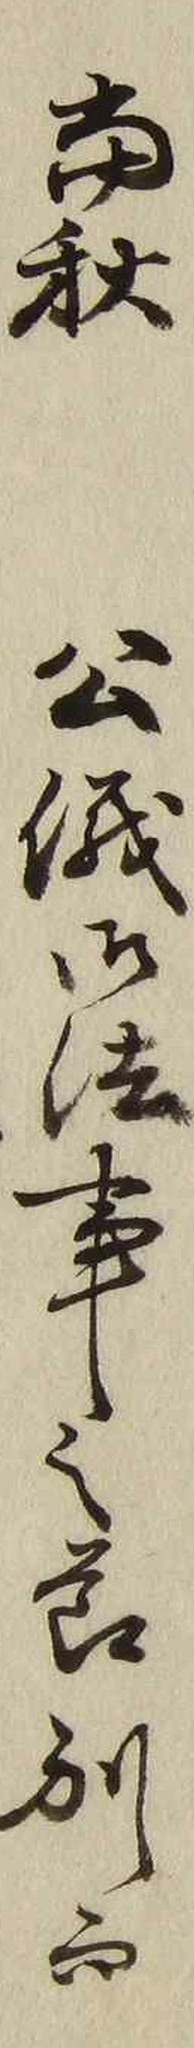当秋公儀御法事之節別而
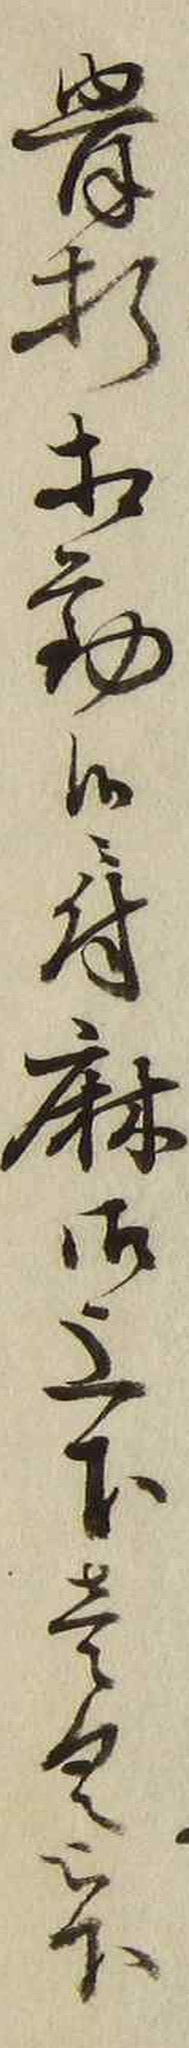骨折相勤候ニ付麻御上下壱具被下

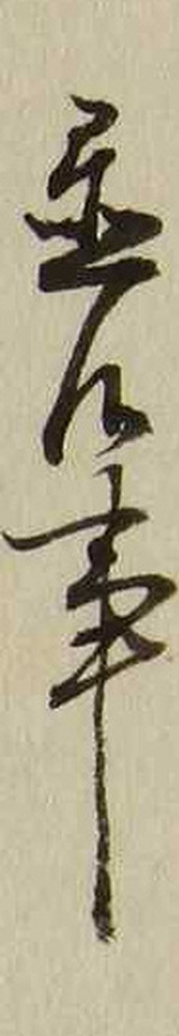置候事
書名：諸士系譜　巻之35　は之部3
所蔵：会津若松市立会津図書館
